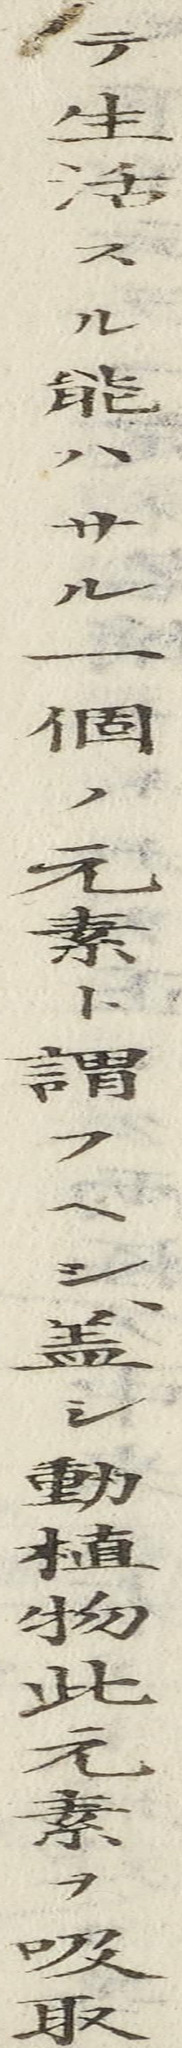テ生活スル能ハサル一個ノ元素ト謂フヘシ、盖シ動植物此元素ヲ吸取
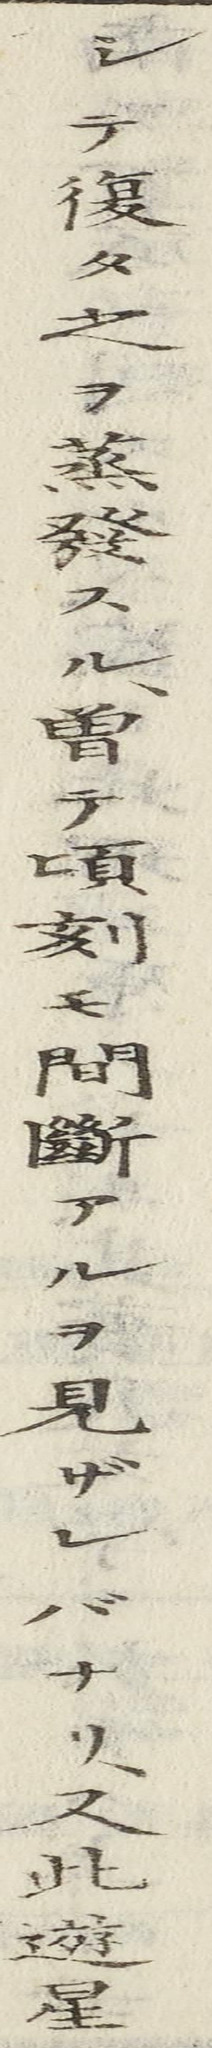シテ復タ之ヲ蒸発スル、曾テ頃刻モ間断アルヲ見ザレバナリ、又此遊星
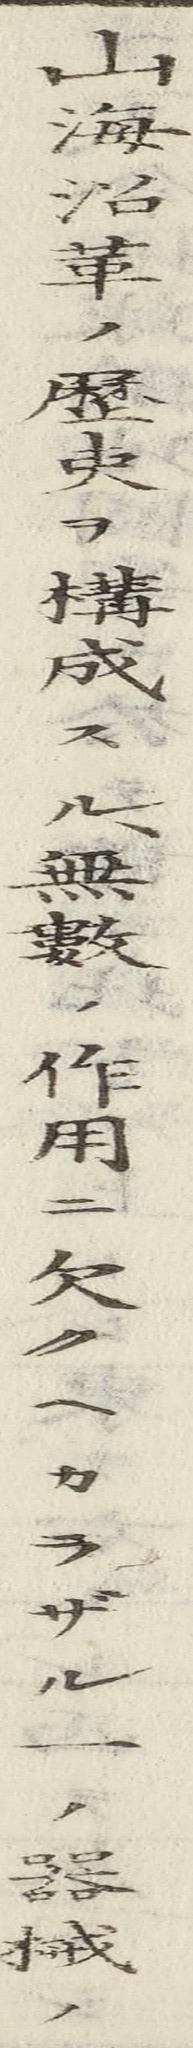山海沿革ノ歴史ヲ構成スル、無数ノ作用ニ欠クヘカラザル一ノ器械ノ
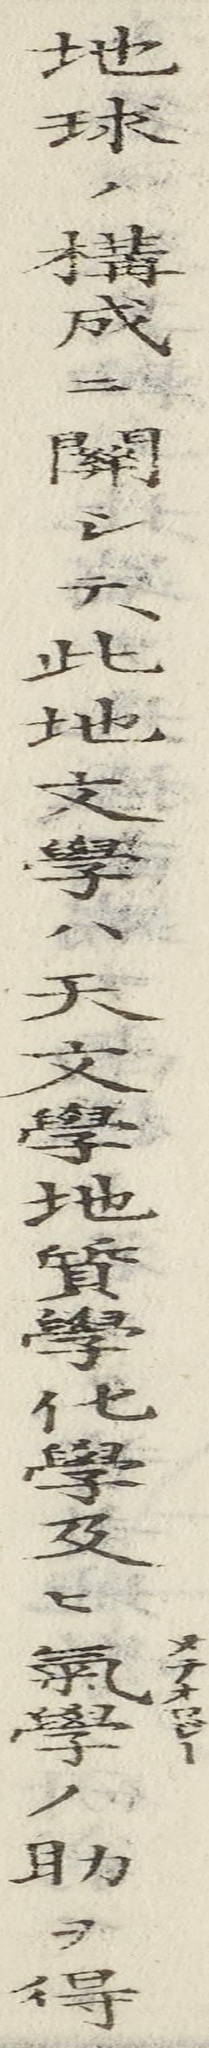地球ノ構成ニ関シテ、此地文学ハ天文学地質学化学及ヒ気学ノ助ヲ得
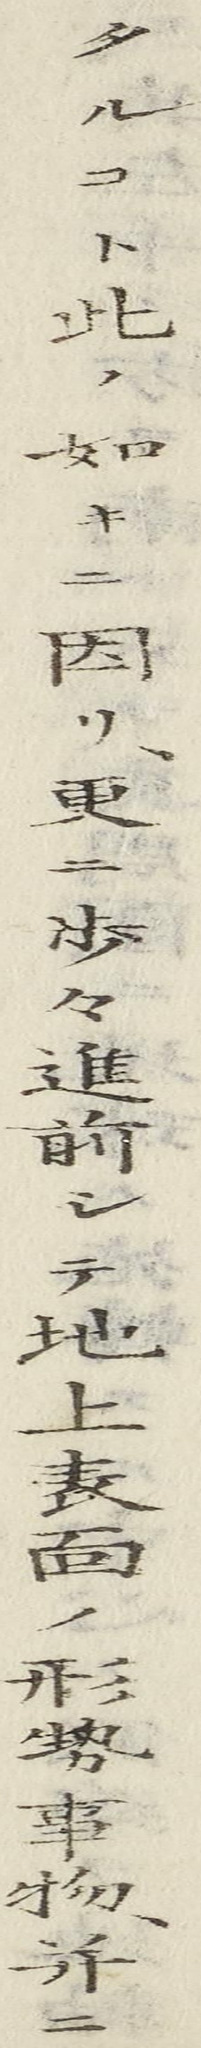タルコト此ノ如キニ因リ、更ニ歩々進前シテ地上表面ノ形勢事物、幷ニ
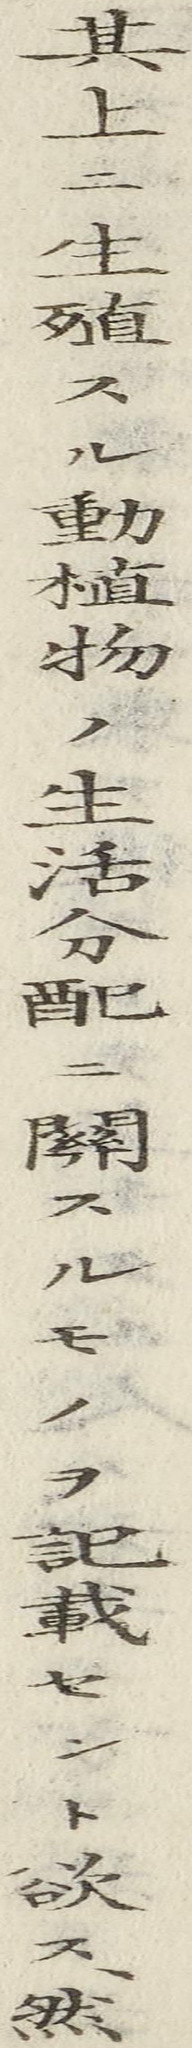其上ニ生殖スル動植物ノ生活分配ニ関スルモノヲ記載セント欲ス、然
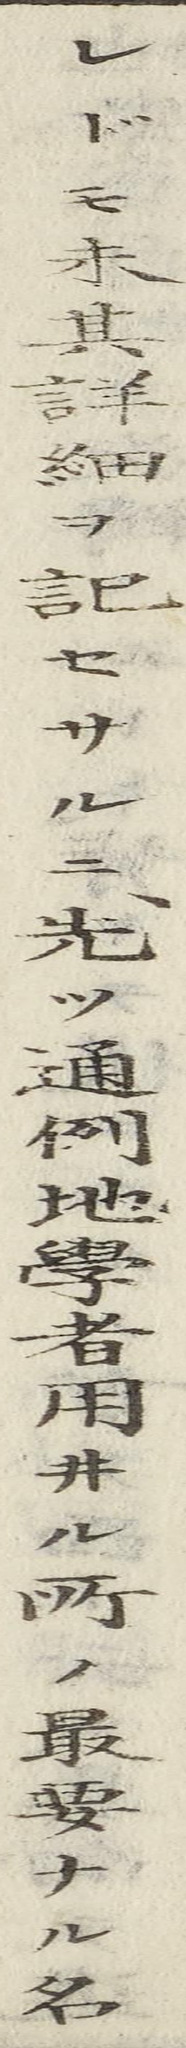レドモ未其詳細ヲ記セサルニ、先ツ通例地学者用ヰル所ノ最要ナル名
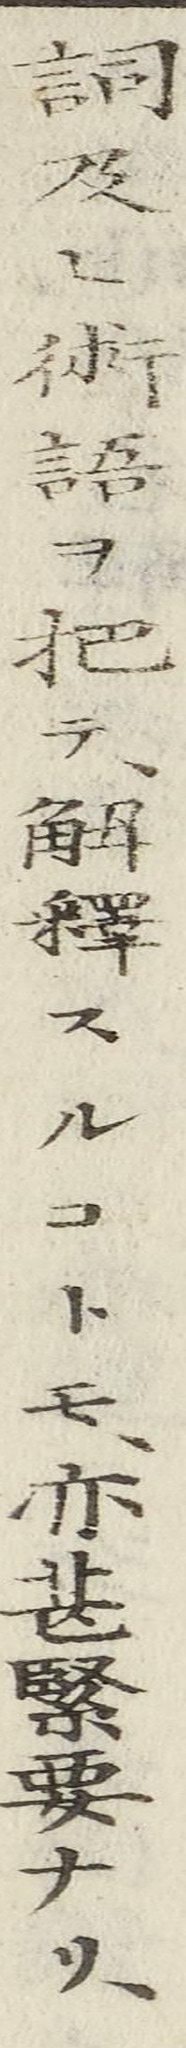詞及ヒ術語ヲ把テ、解釈スルコトモ、亦甚緊要ナリ、

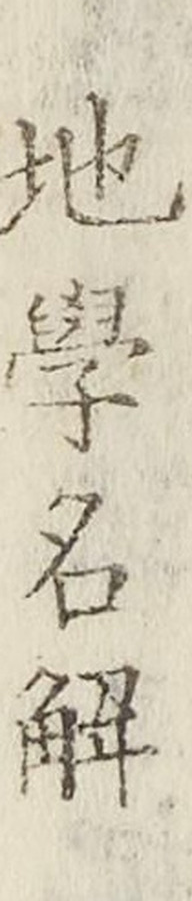地学名解
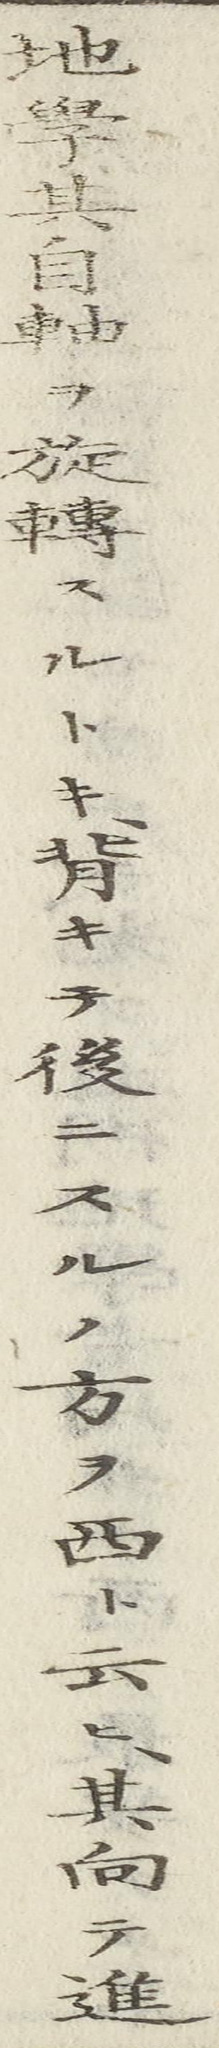地学其自軸ヲ旋転スルトキ、背キテ後ニスルノ方ヲ西ト云ヒ、其向テ進
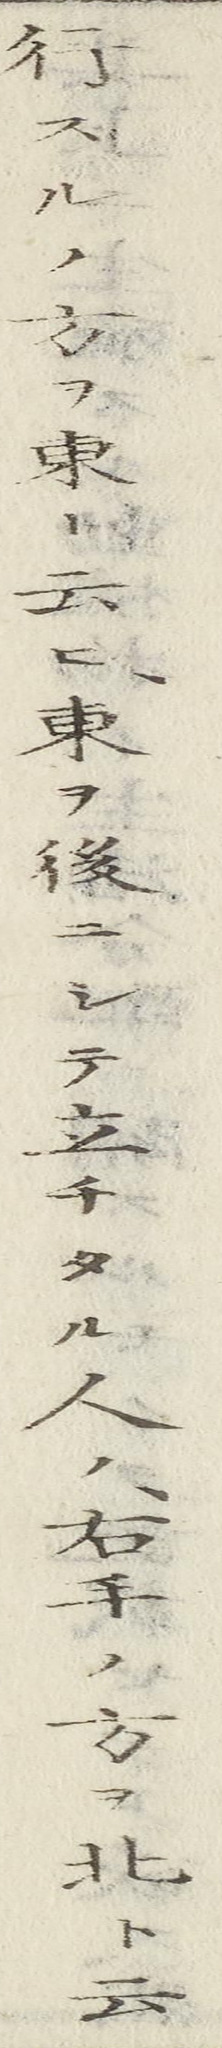行スルノ方ヲ東ト云ヒ、東ヲ後ニシテ立チタル人ノ、右手ノ方ヲ北ト云
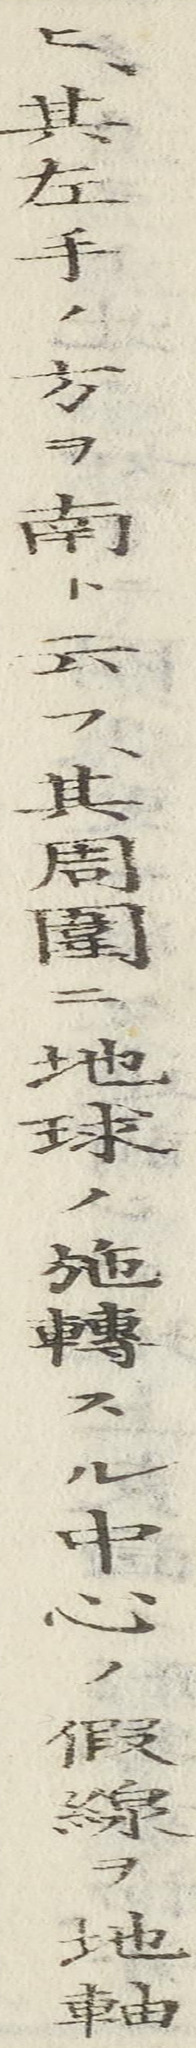ヒ、其左手ノ方ヲ南ト云フ、其周囲ニ地球ノ旋転スル中心ノ仮線ヲ地軸
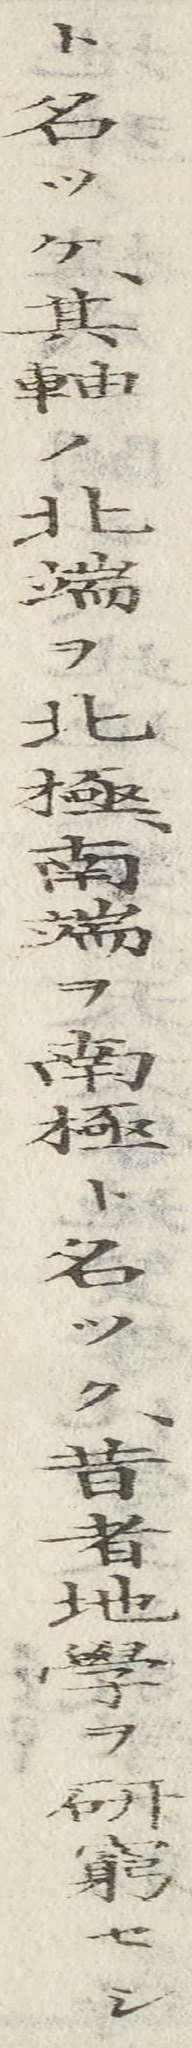ト名ツケ、其軸ノ北端ヲ北極、南端ヲ南極ト名ツク、昔者地学ヲ研窮セシ
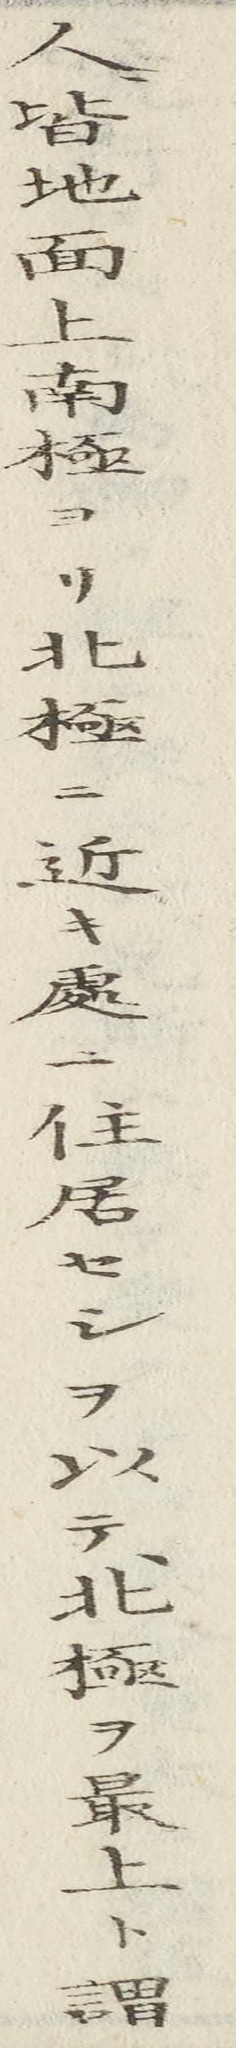人、皆地面上南極ヨリ北極ニ近キ処ニ住居セシヲ以テ、北極ヲ最上ト謂
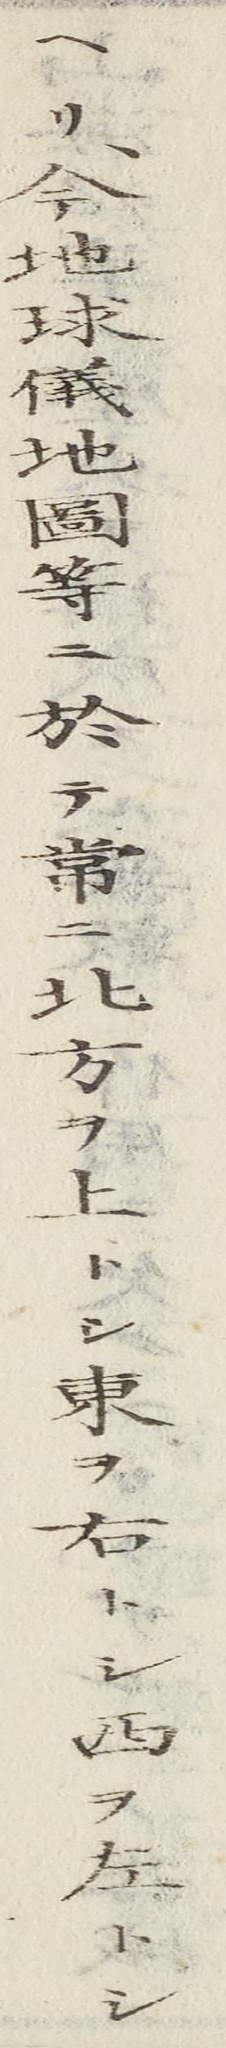ヘリ、今地球儀地図等ニ於テ常ニ北方ヲ上トシ東ヲ右トシ西ヲ左トシ
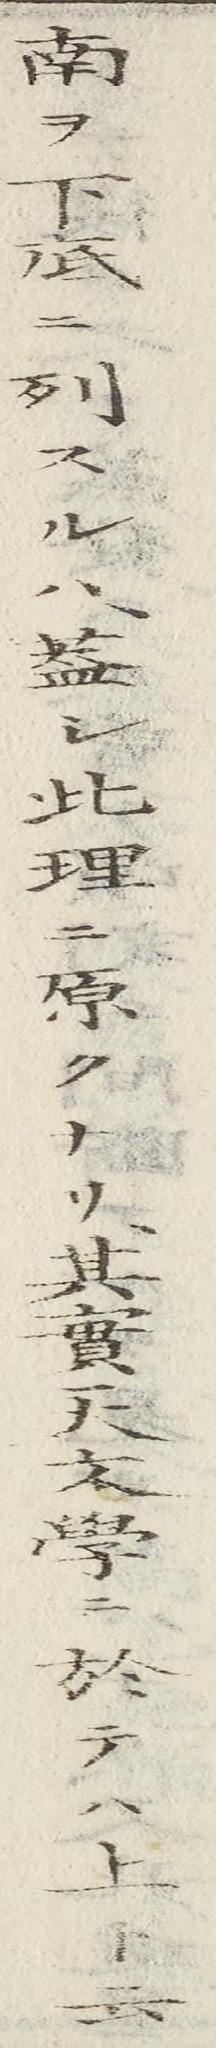南ヲ下底ニ列スルハ、蓋シ此理ニ原クナリ、其実天文学ニ於テハ上ト云
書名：百科全書　地文學　全
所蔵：東京大学地震研究所図書室 Earthquake Research Institute Library, The University of Tokyo, JAPAN
